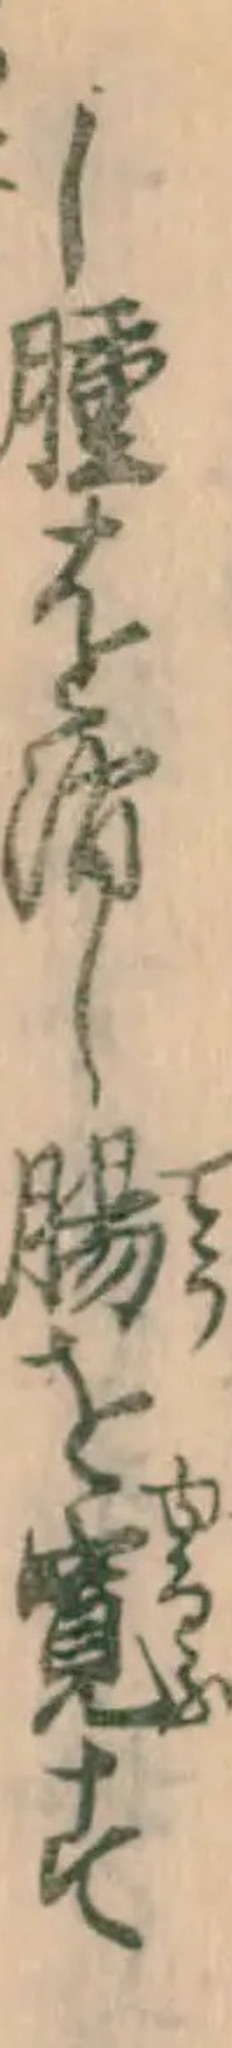し腫を消し腸を寛す
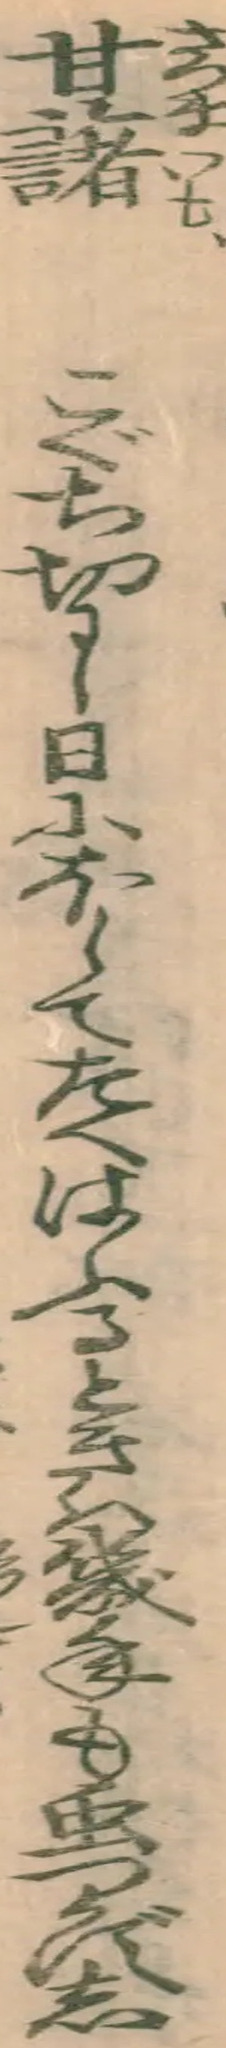甘藷こぐち切にし日にほしてたくはふるときは幾年も虫つかずし
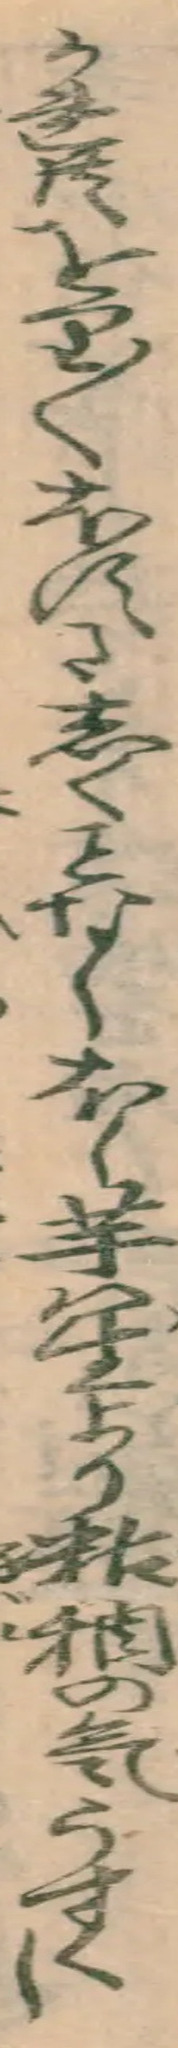かれ共をり〳〵ほすにしくことなしほし芋は生より粘稠の気うすくし
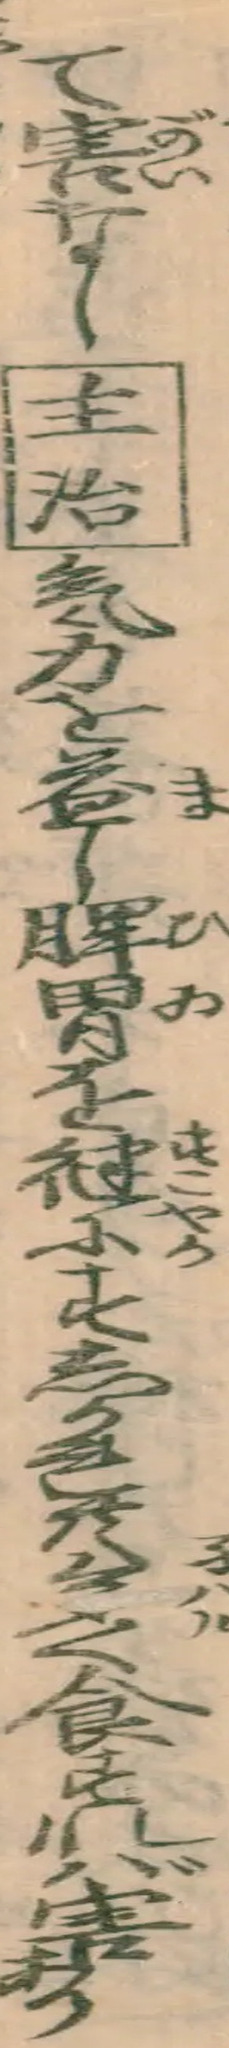て害なし[主治]気力を益し脾胃を健にすしかれ共多く食すれば害あり
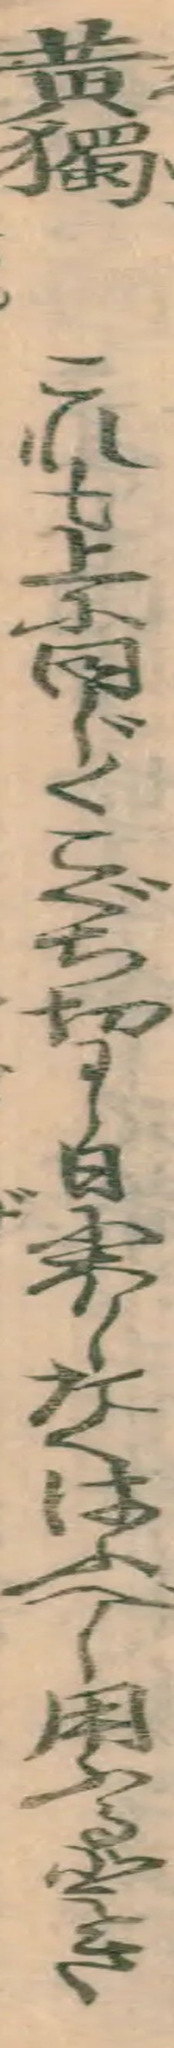黄独これも上に同じくこぐち切にし日にほしたくはふべし用ふるとき
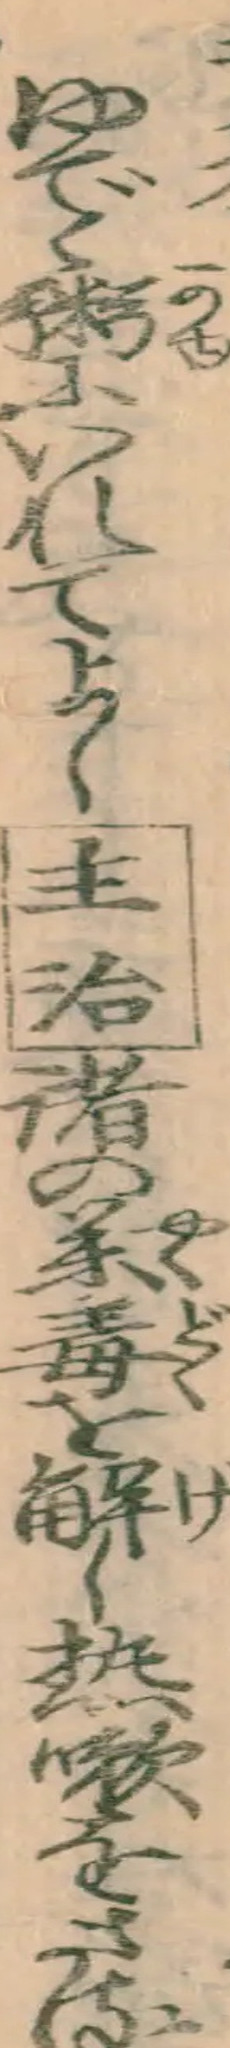ゆでゝ粥にいれてよし[主治]諸の薬毒を解し熱嗽をさる
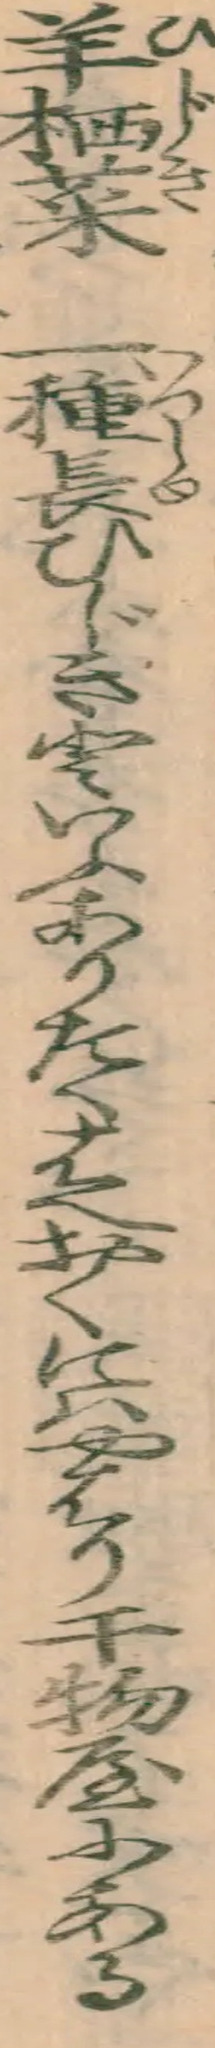羊栖菜一種長ひじきといふありたくはへおくにはやはり干物屋にある
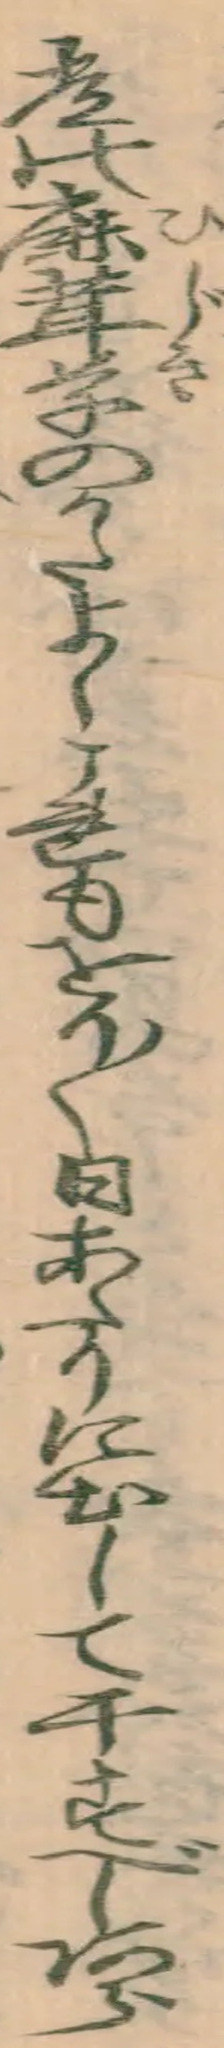常の鹿茸草のかたよしこれもをり〳〵日あたりに出して干すべしあら
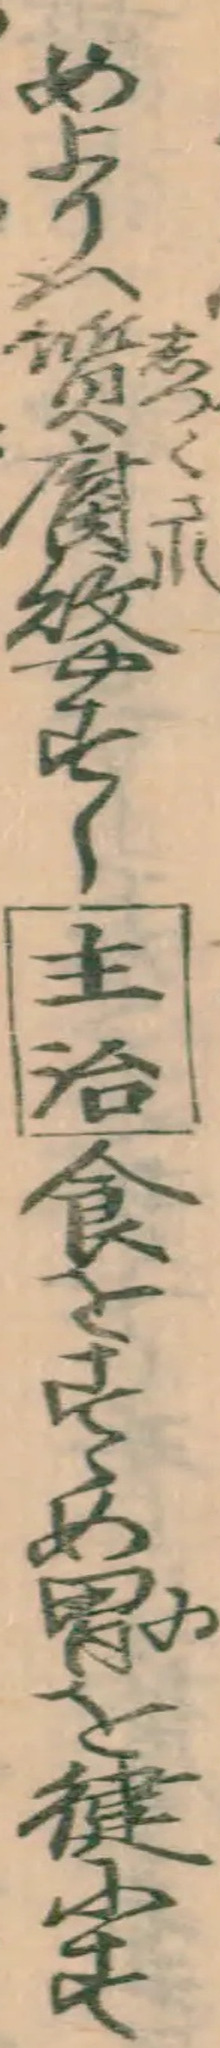めよりは質腐敗やすし[主治]食をすゝめ胃を健にす
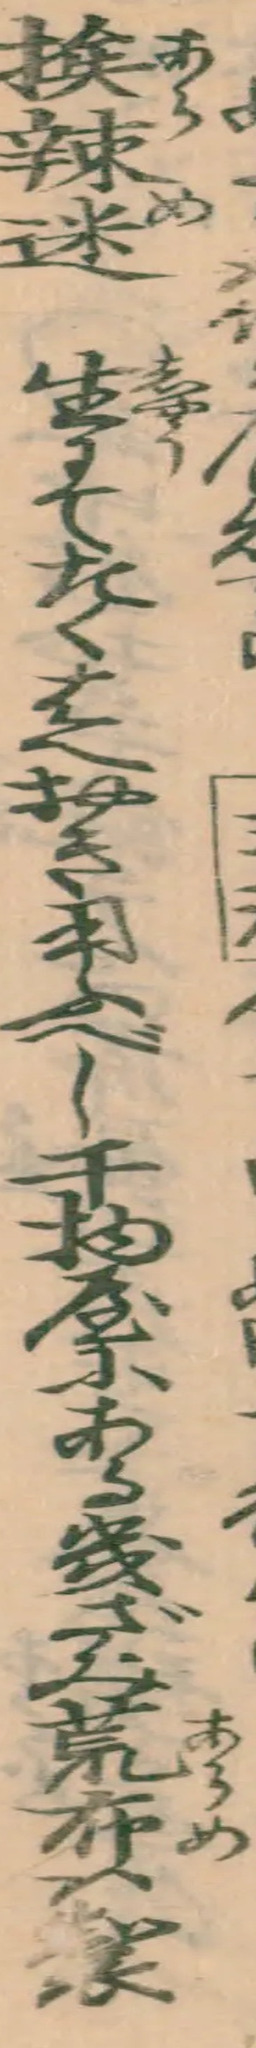挨辣迷生にてたくはへおき用ふべし干物屋にあるきざみ荒布は製
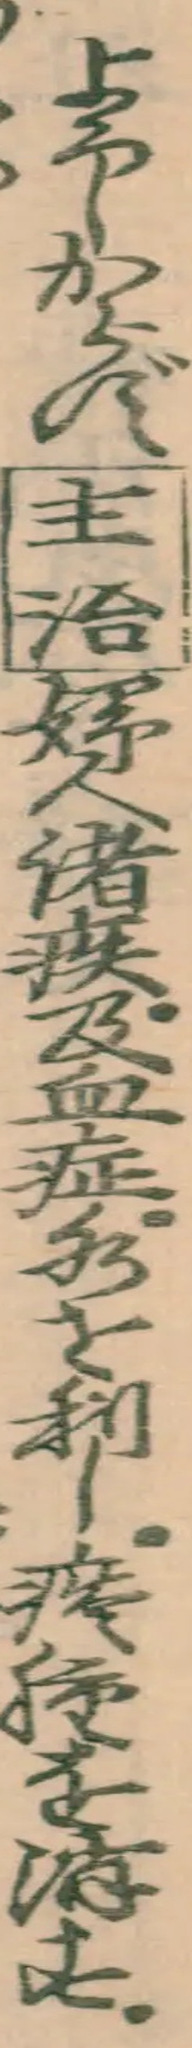よろしからず[主治]婦人諸疾．及血症．水を利し．痰種を消す．
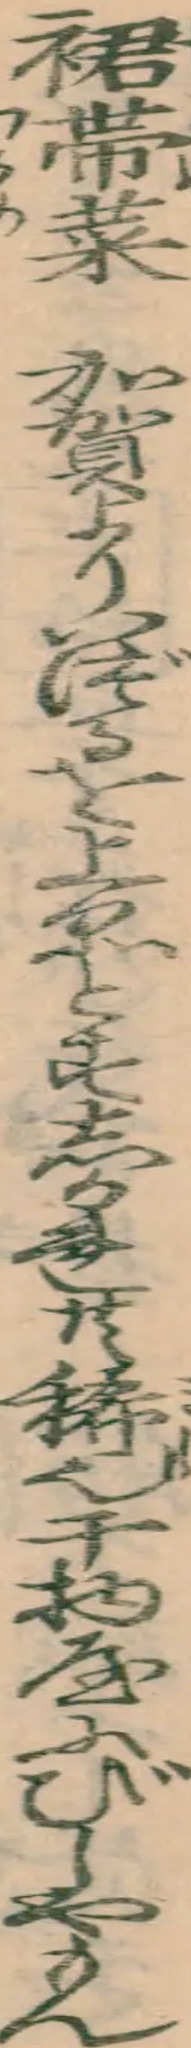裙帯菜加賀よりいづるを上品とすしかれ共稀也干物屋にびしやもん
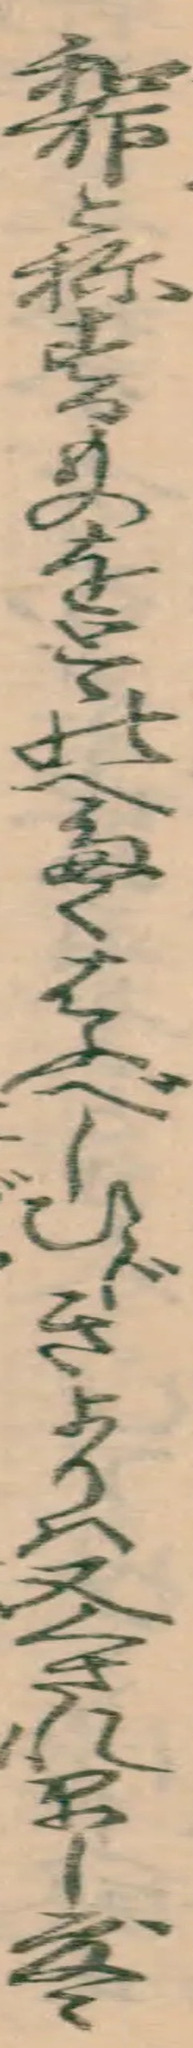和布と称するものをとゝのへたくはふべしひじきよりは又くされ早し度々
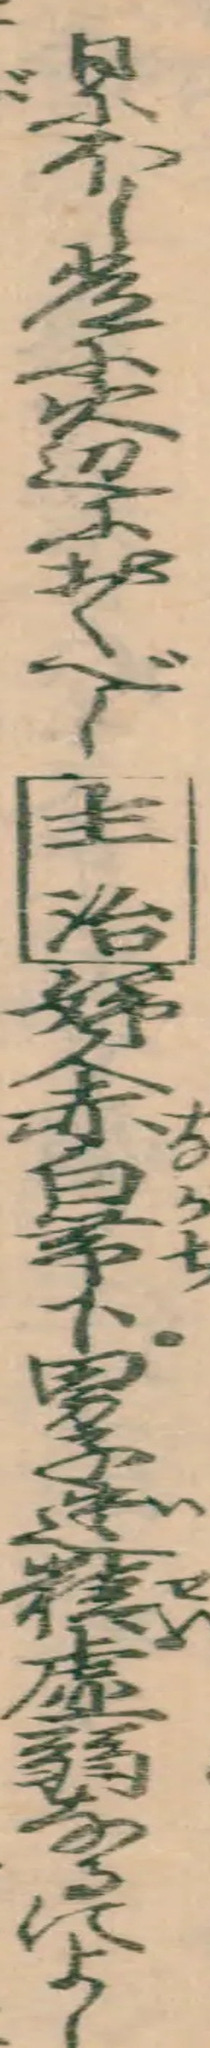日にほし常に火辺におくべし[主治]婦人赤白帯下．男子遺精．虚弱なるによし
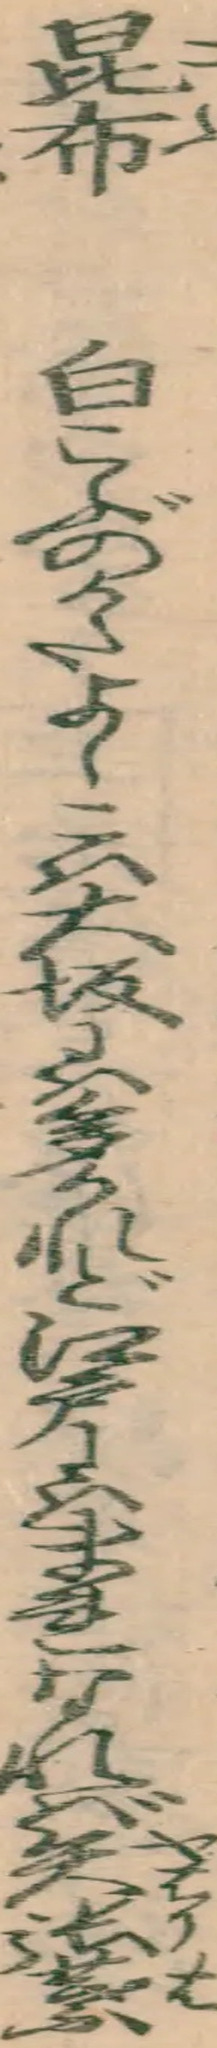昆布白こぶのかたよしこは大坂には多かれど江戸にはまれなれば矢張葉
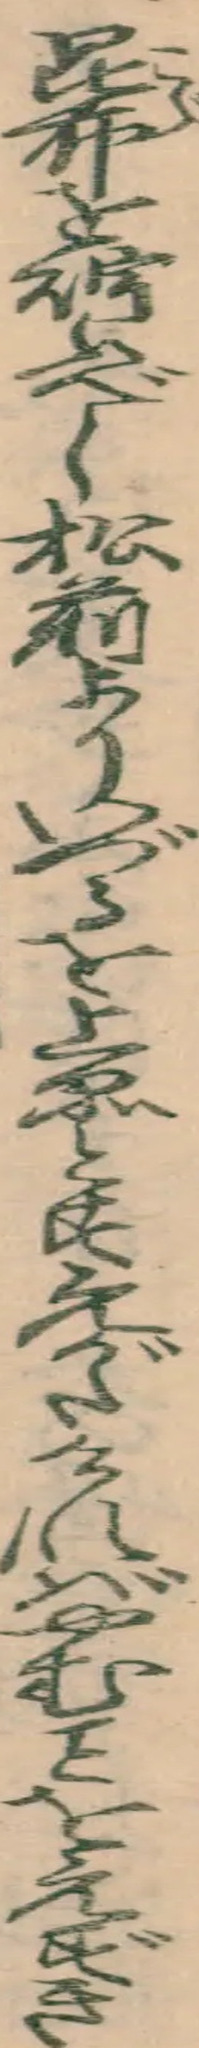昆布を貯ふべし松前よりいづるを上品とすえがたければやむことをえずき
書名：日ごとの心得
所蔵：国立国会図書館 National Diet Library, JAPAN
